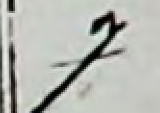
7
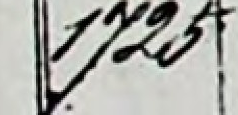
1725
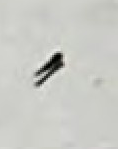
„
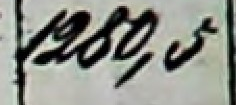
1280,5
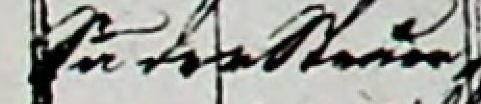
In der Steuer„
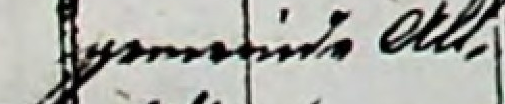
gemeinde Alt„
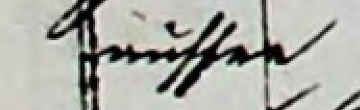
aussee
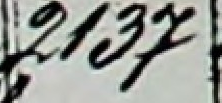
2137
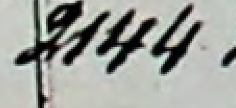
2144
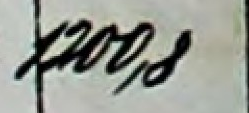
1200,8
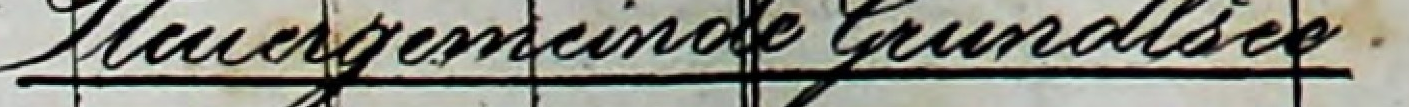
Steuergemeinde Grundlsee.
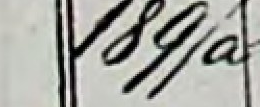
189/a
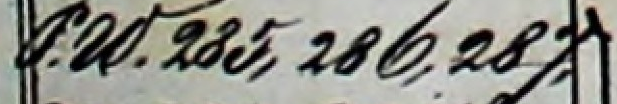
P.W. 285, 286, 287,
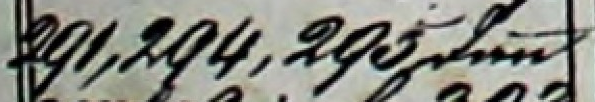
291, 294, 295 dann
